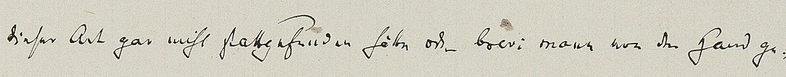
dieser Art gar nicht stattgefunden hätte oder brevi manu von der Hand ge-
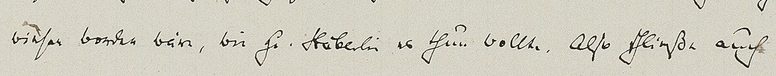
wiesen worden wäre, wie Hr. Häberlin es thun wollte. Also schließe auch
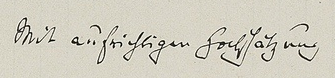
Mit aufrichtiger Hochschätzung
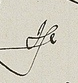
Ihr
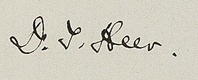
Dr J. Heer.
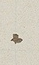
Abds.
